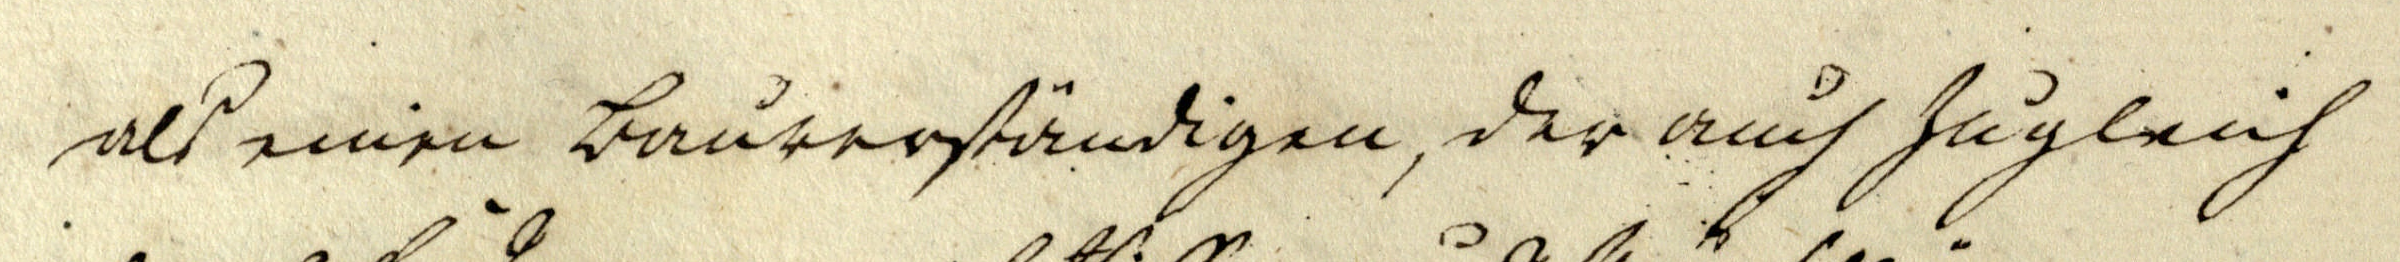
als einen Bauverständigen, der auch zugleich
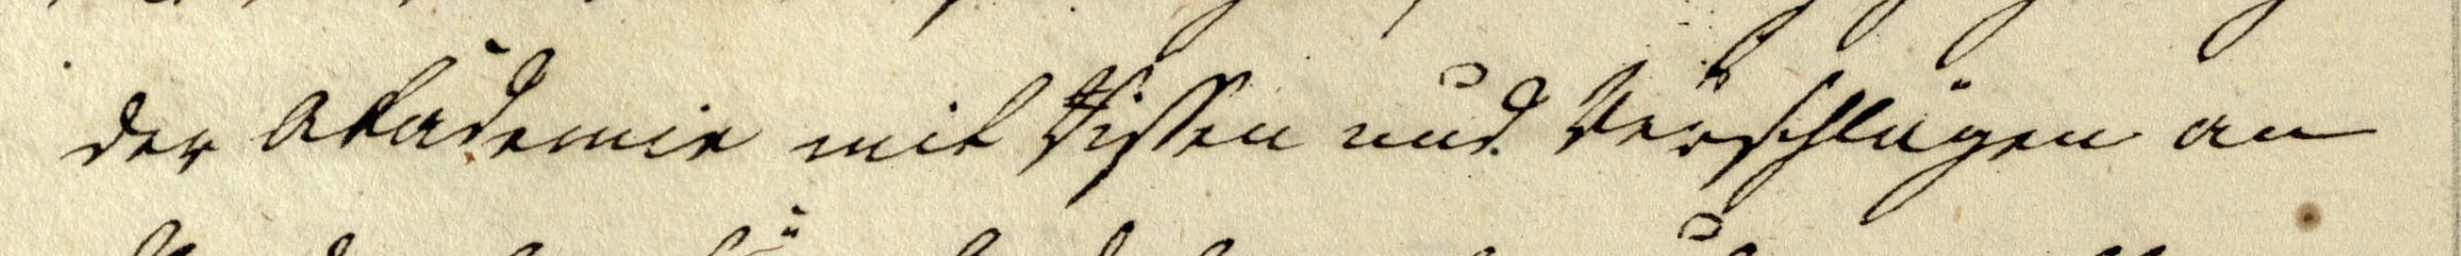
der Akademie mit Rissen und Verschlägen an
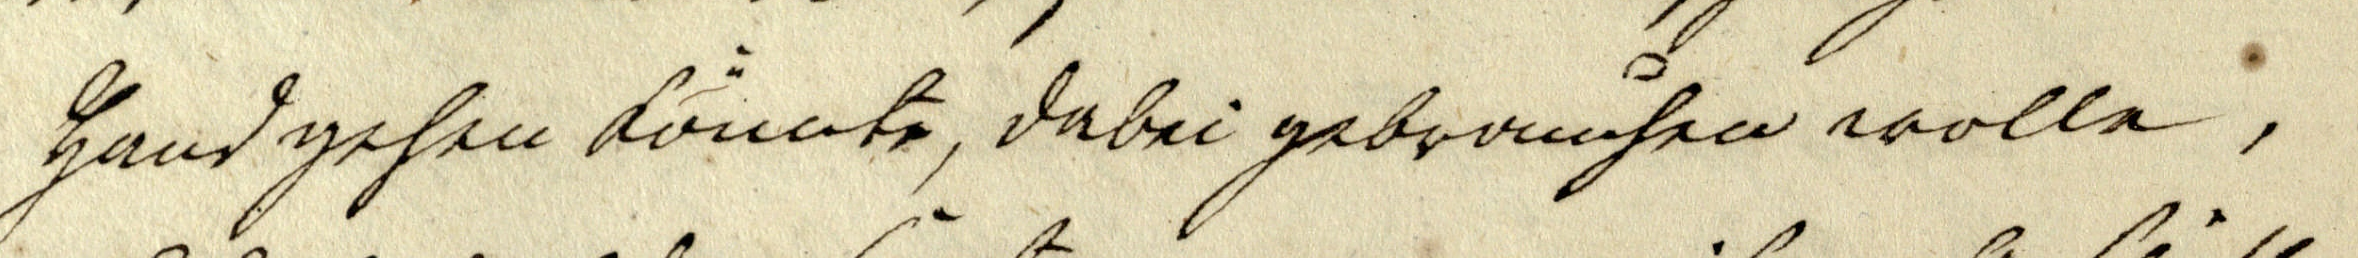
Hand gehen könnte, dabei gebrauchen wolle,
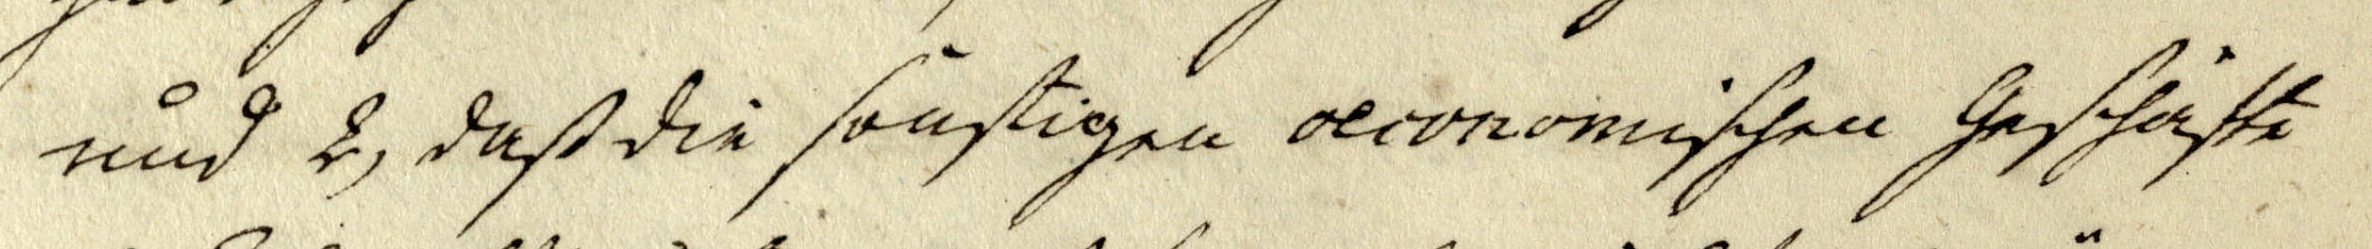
und 2, daß die sonstigen oeconomischen Geschäfte
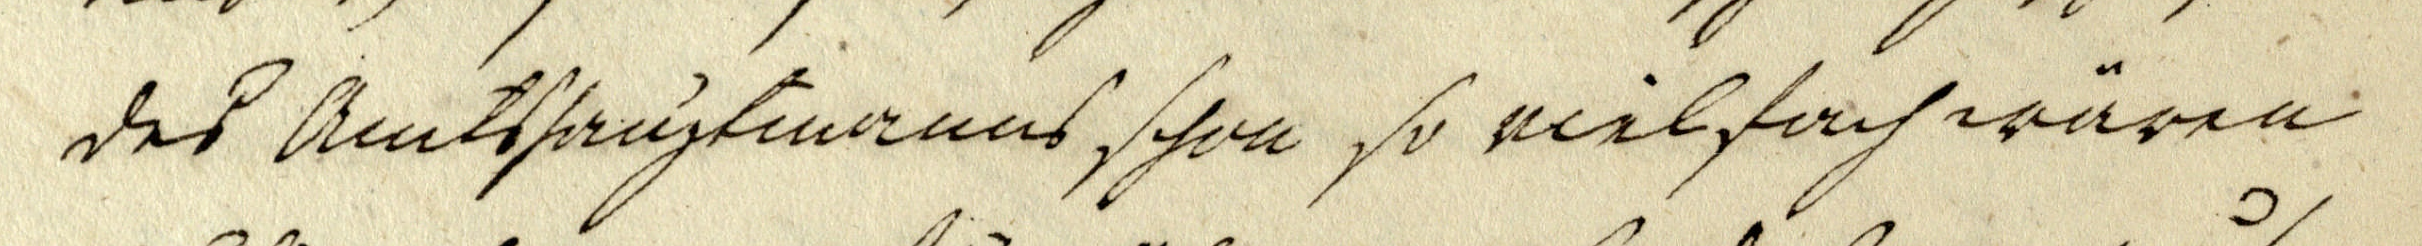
des Amtshauptmanns schon so vielfach wären
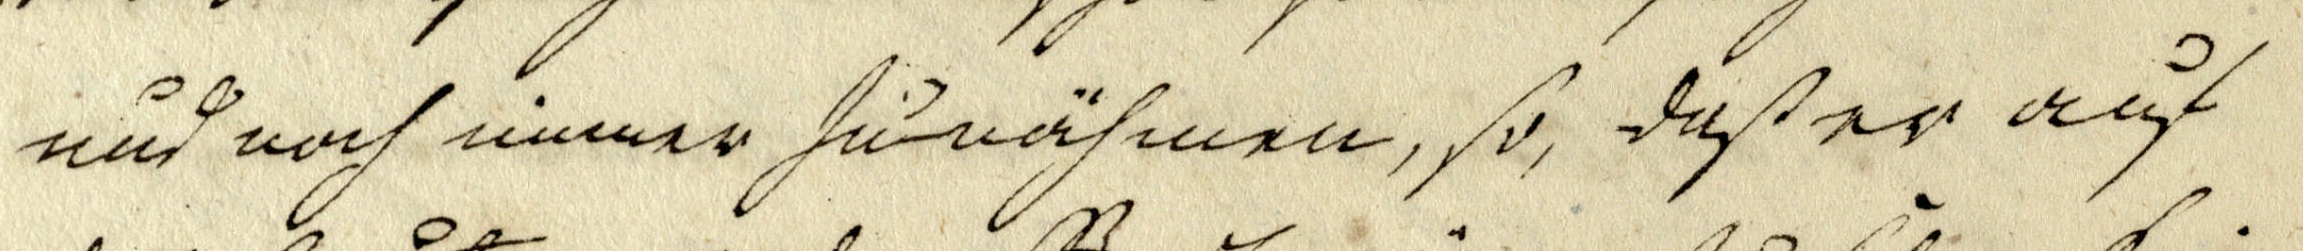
und noch immer zunähmen, so, daß er auf
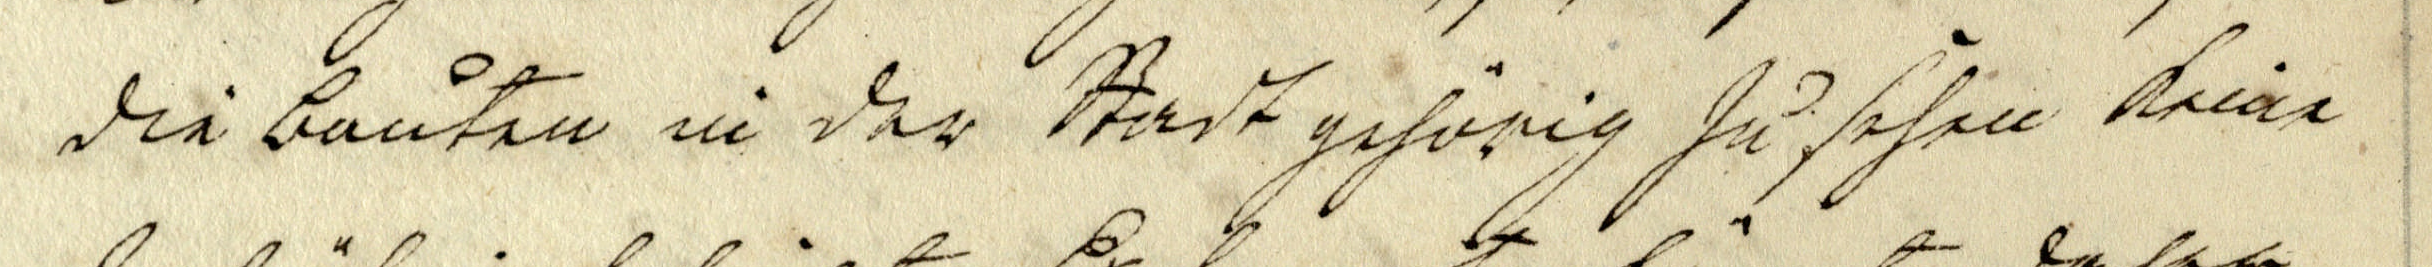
die Bauten in der Stadt gehörig zu sehen keine
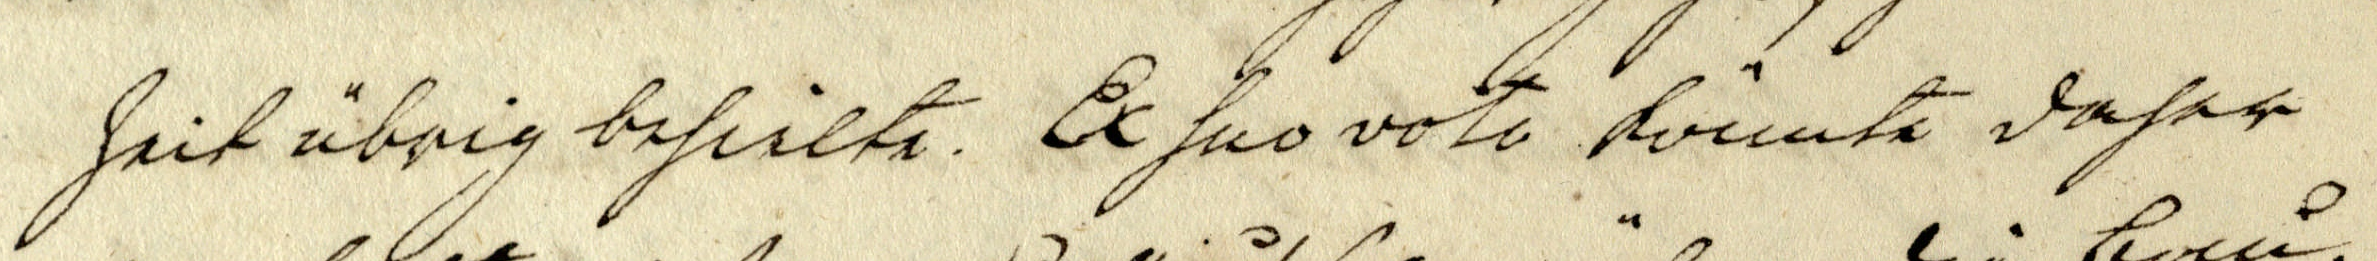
Zeit übrige behielte. Ex suo voto könnte daher
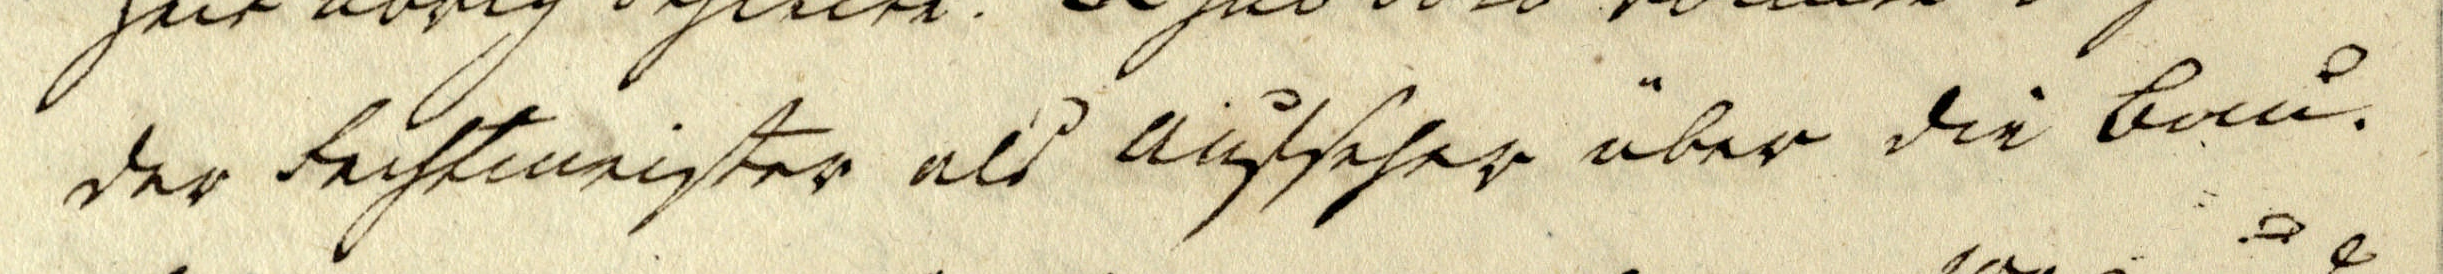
der Fechtmeister als Aufseher über die Bau¬
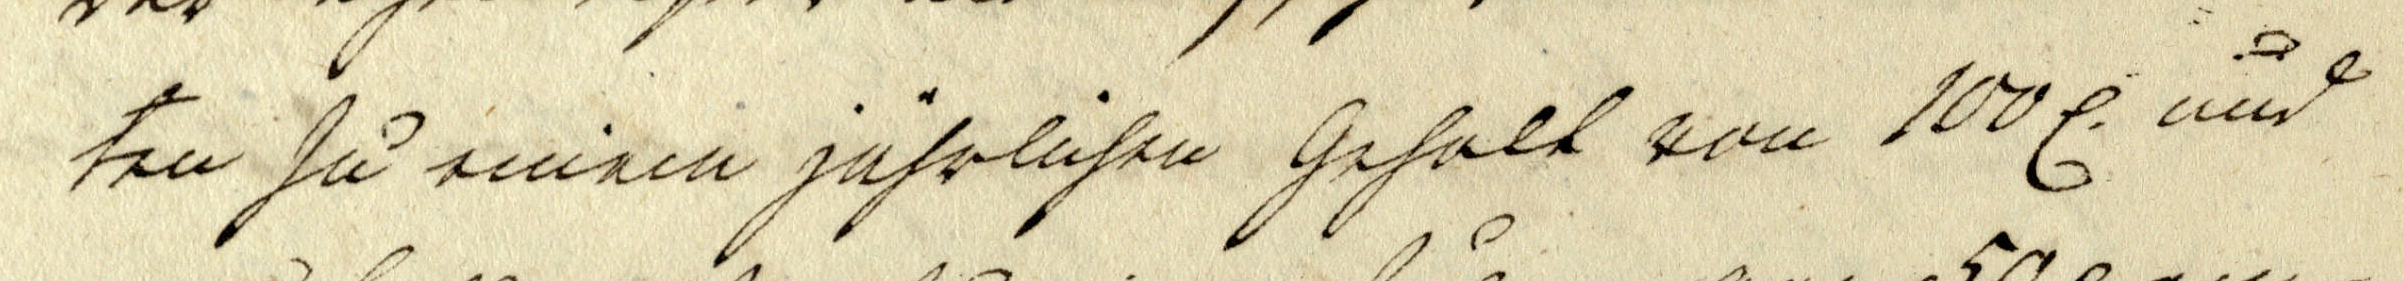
ten zu einem jährlichen Gehalt von 100 l. und
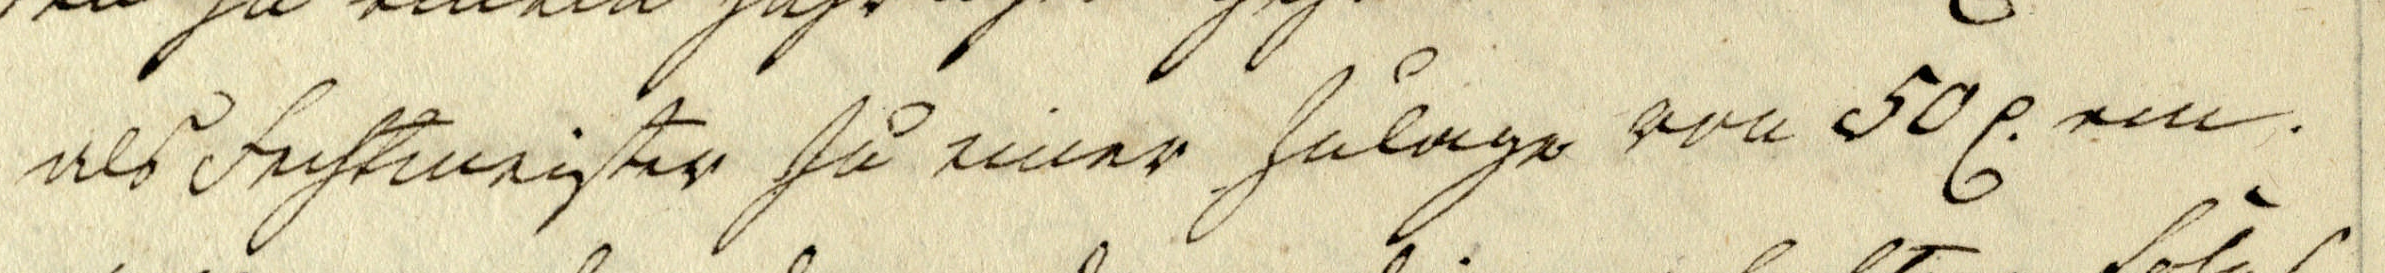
als Fechtmeister zu einer Zulage von 50 l. em¬
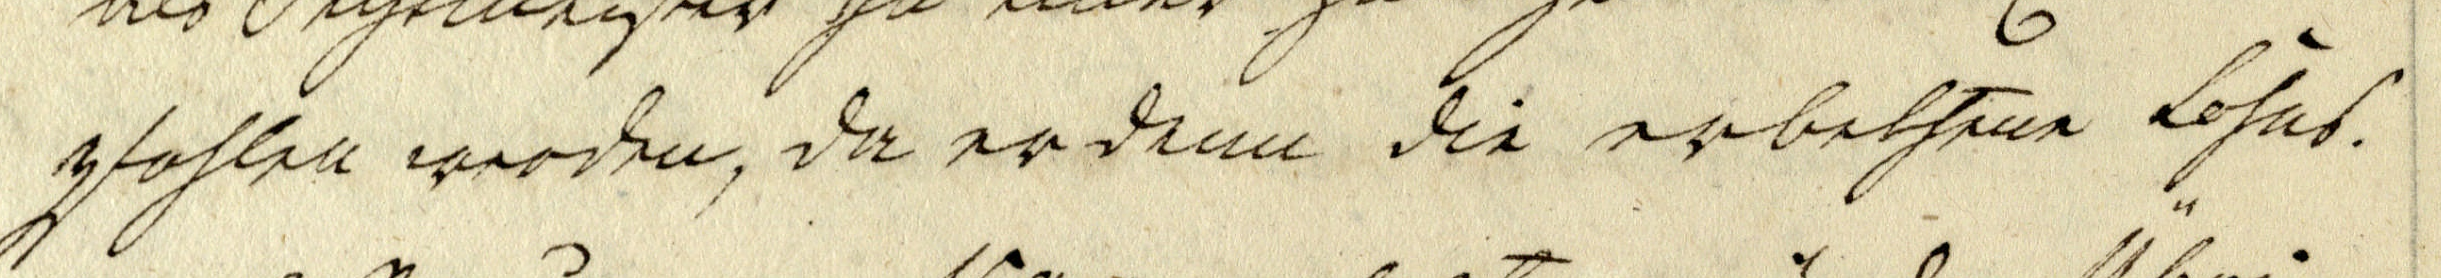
pfohlen werden, da er denn die erbethene Lohns¬
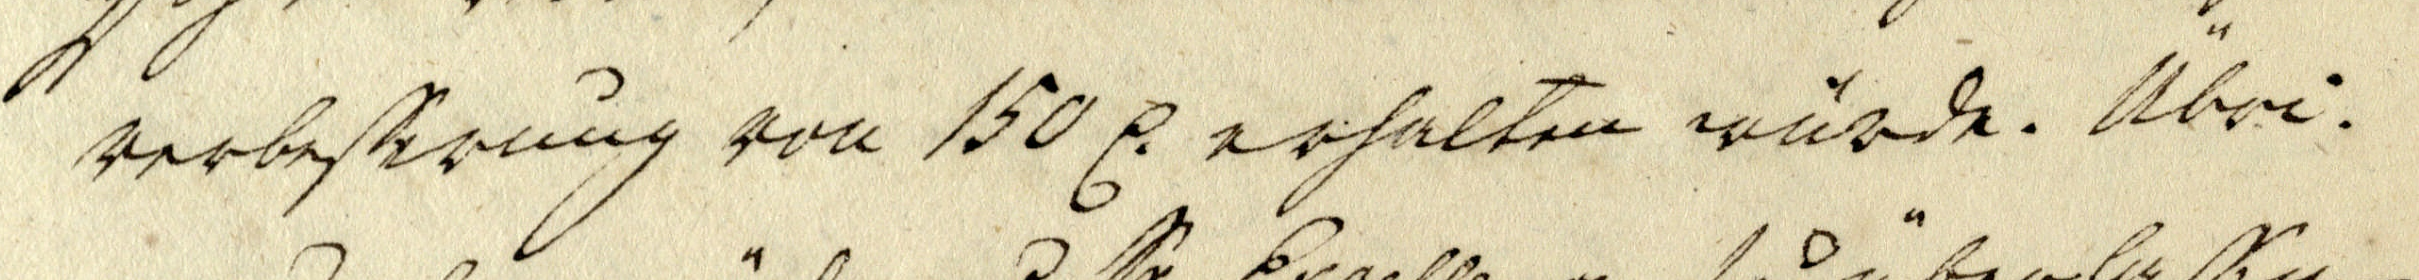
verbesserung von 150 l. erhalten würde. Übri¬
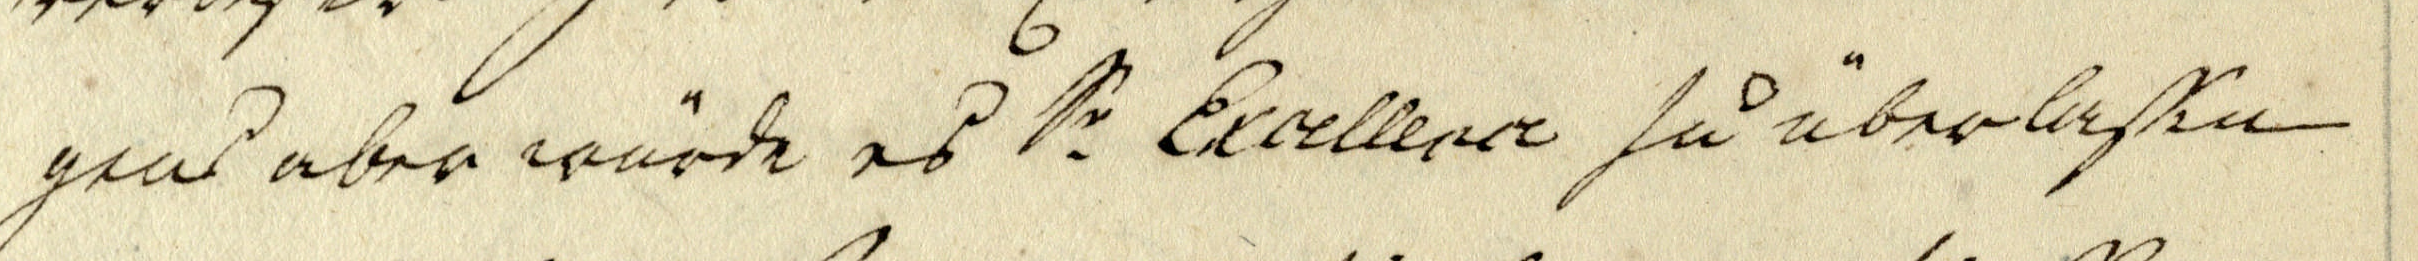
gens aber würde es Sr Excellence zu überlassen
